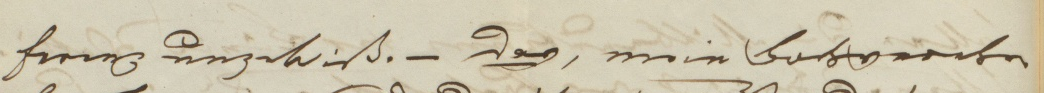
ferenz ungewiß. – Das, mein hochverehr-
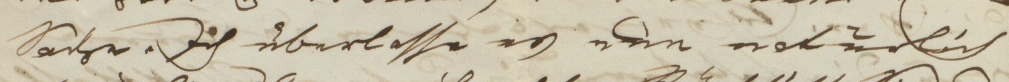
Sache. Ich überlasse es nun natürlich
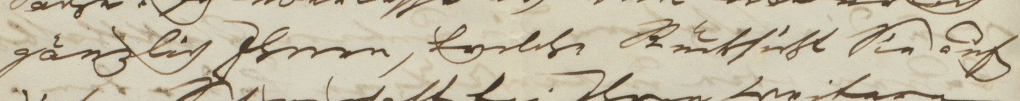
gänzlich Ihnen, welche Rücksicht Sie auf
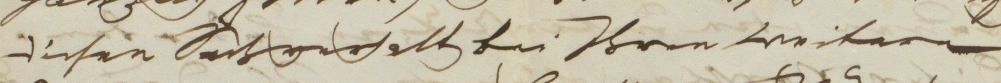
diesen Sachverhalt bei Ihren weitern
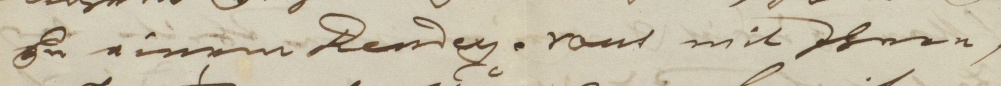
zu einem Rendez–vous mit Ihnen,
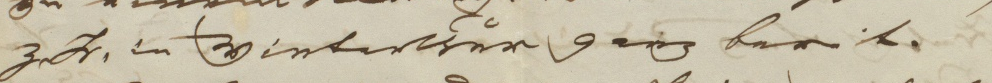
z. B. in Winterhur ganz bereit.
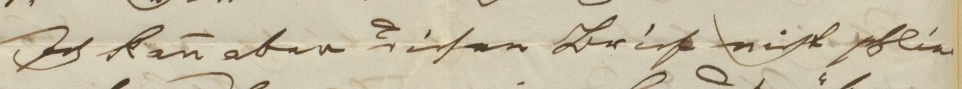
Ich kann aber diesen Brief nicht schlie-
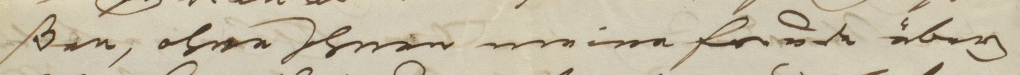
ßen, ohne Ihnen meine Freude über
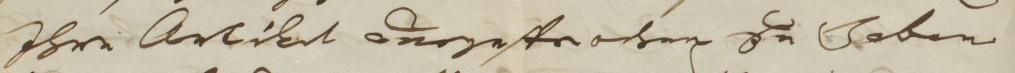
Ihre Artkel ausgesprochen zu haben.
